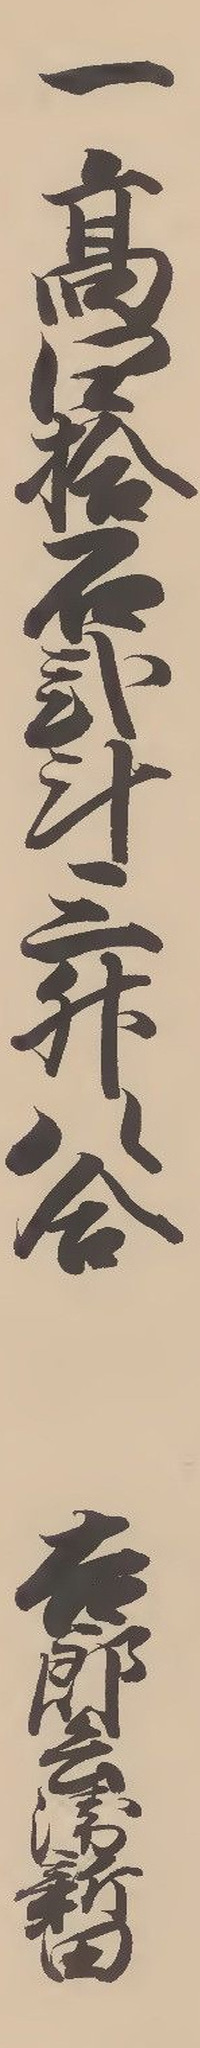一高四拾石弐斗三升八合太郎兵衛新田
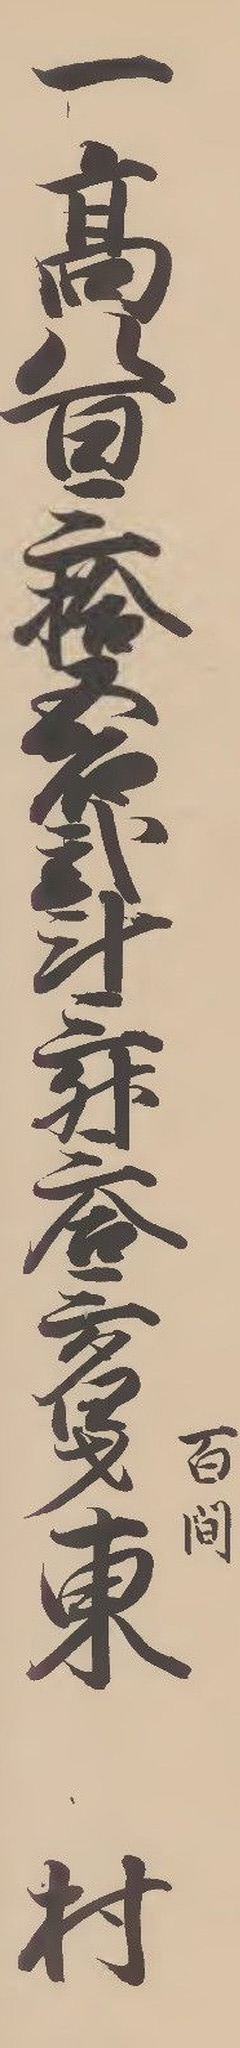一高八百三拾五石弐斗三升三合三勺四才東村
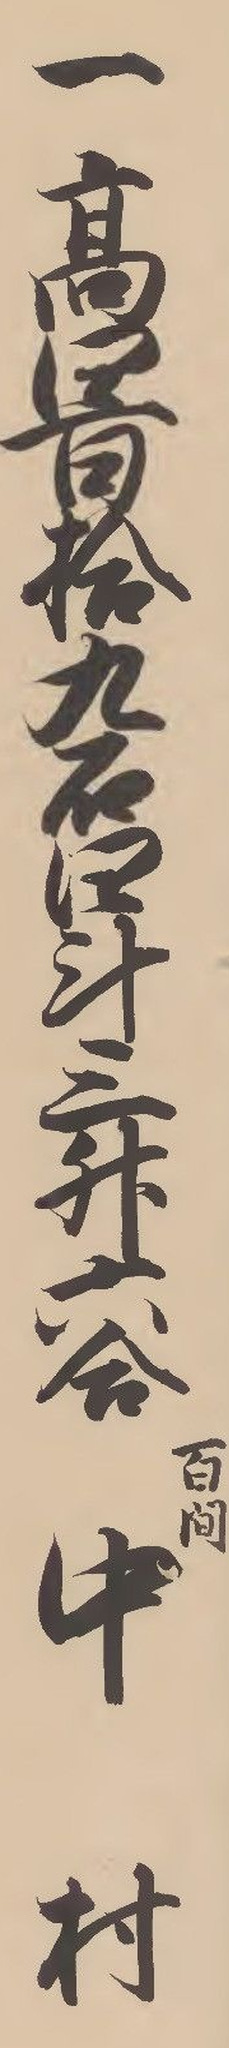一高四百拾九石四斗三升六合中村
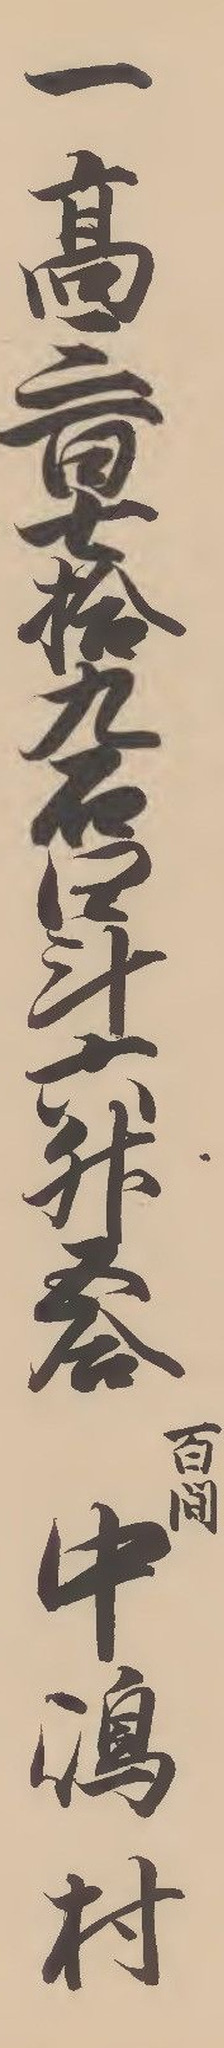一高三百七拾九石四斗六升五合中嶋村
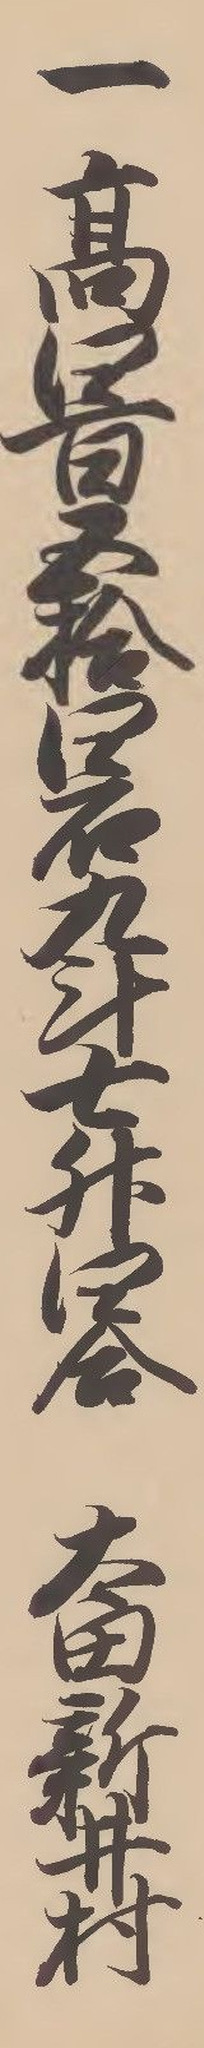一高四百五拾四石九斗七升四合太田新井村
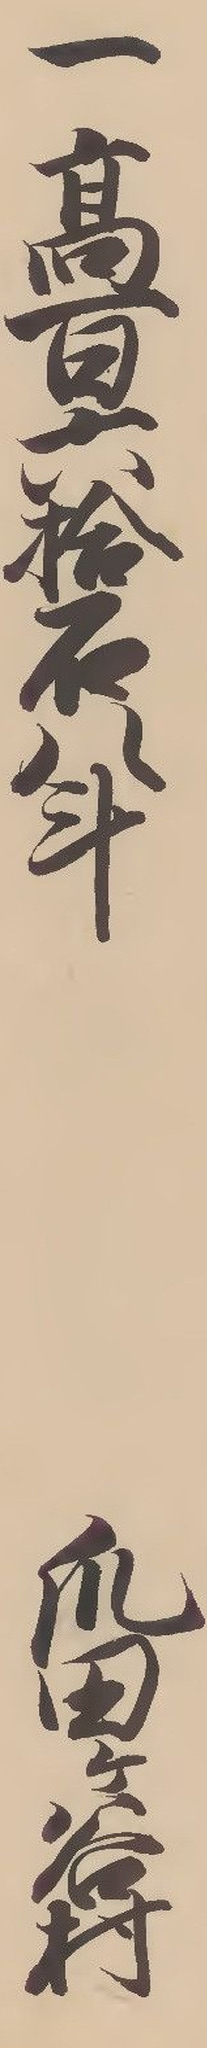一高百六拾石八斗爪田ヶ谷村

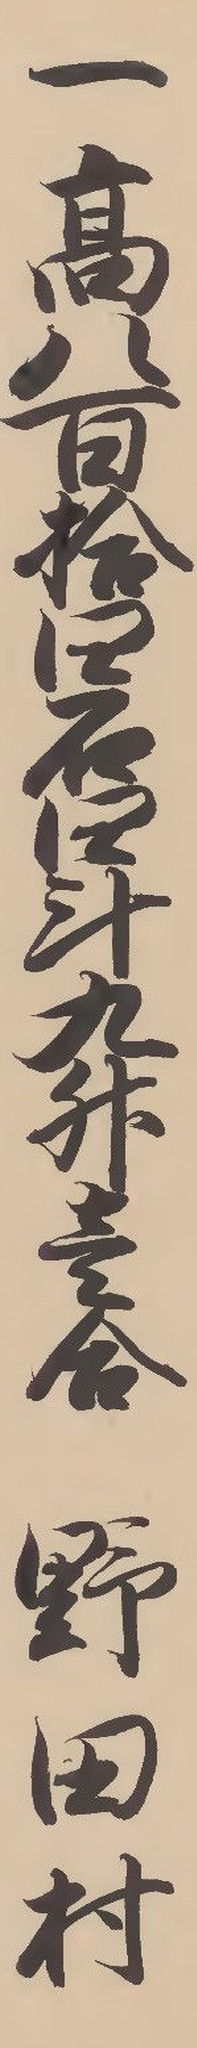一高八百拾四石四斗九升壱合野田村
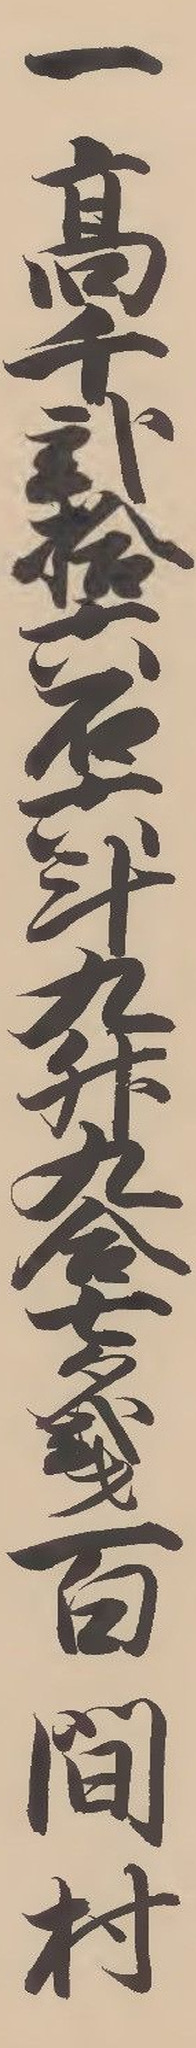一高千弐拾六石六斗九升九合七勺弐才百間村
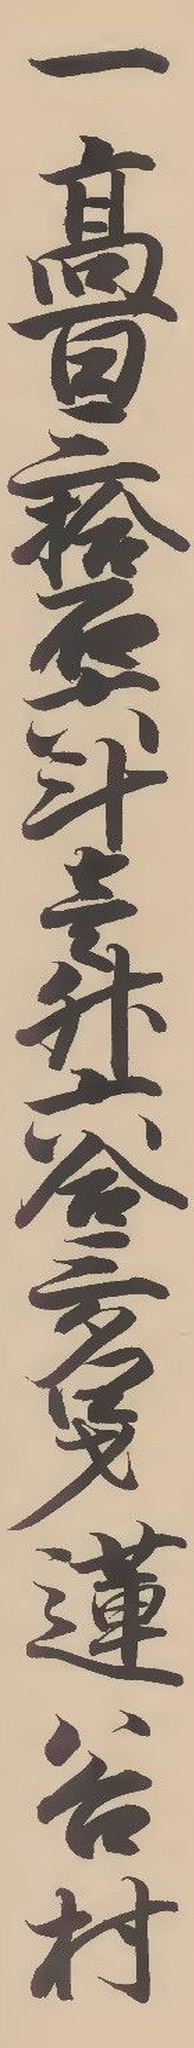一高百三拾石六斗壱升六合三才四勺蓮谷村
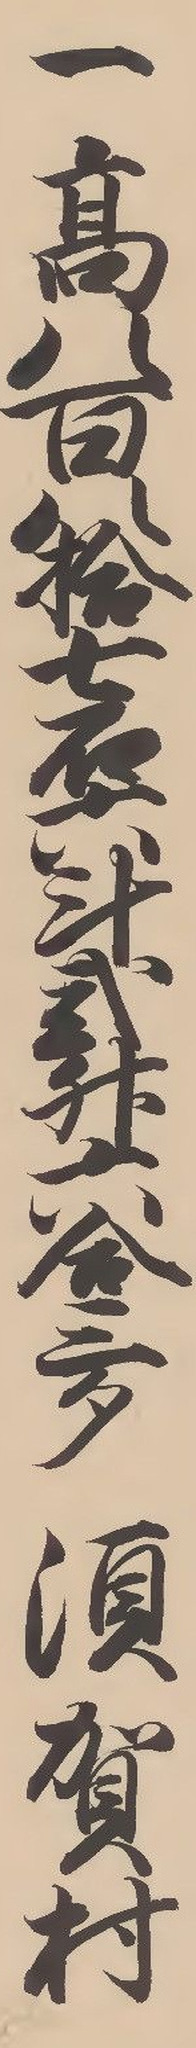一高八百八拾七石六斗弐升六合三勺須賀村
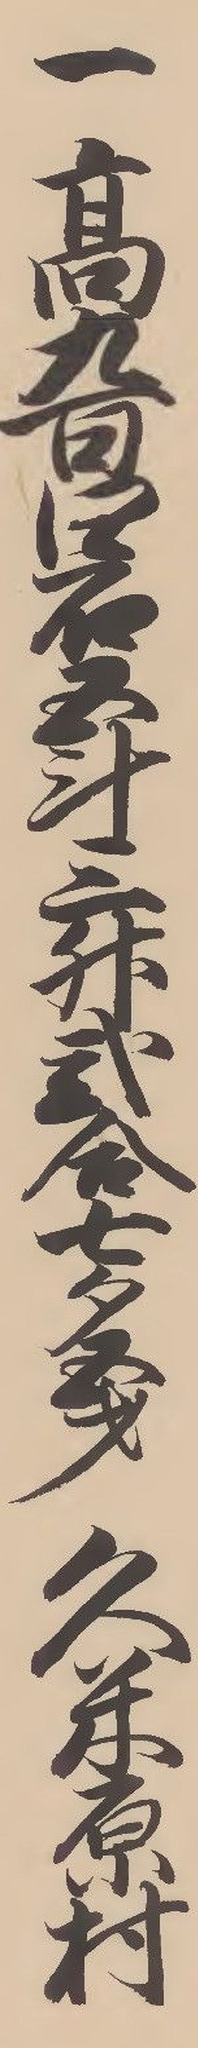一高九百四石五斗三升弐合七勺五才久米原村
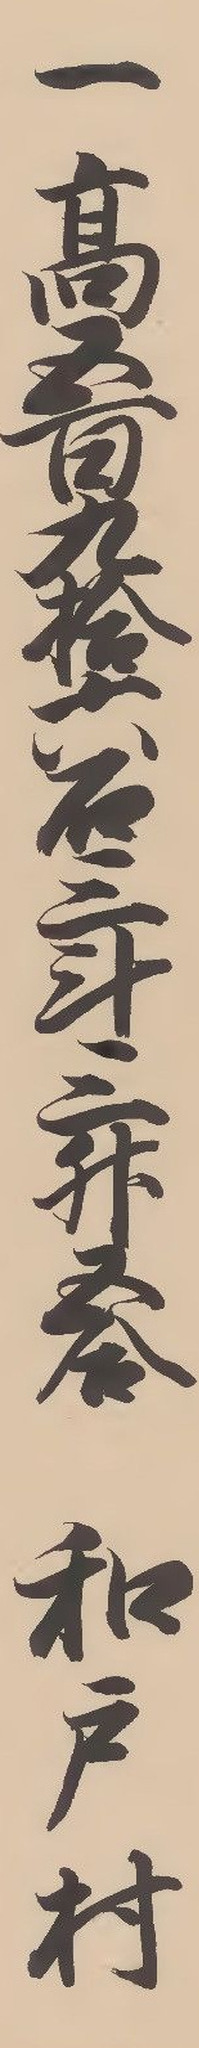一高五百九拾六石三斗三升五合和戸村
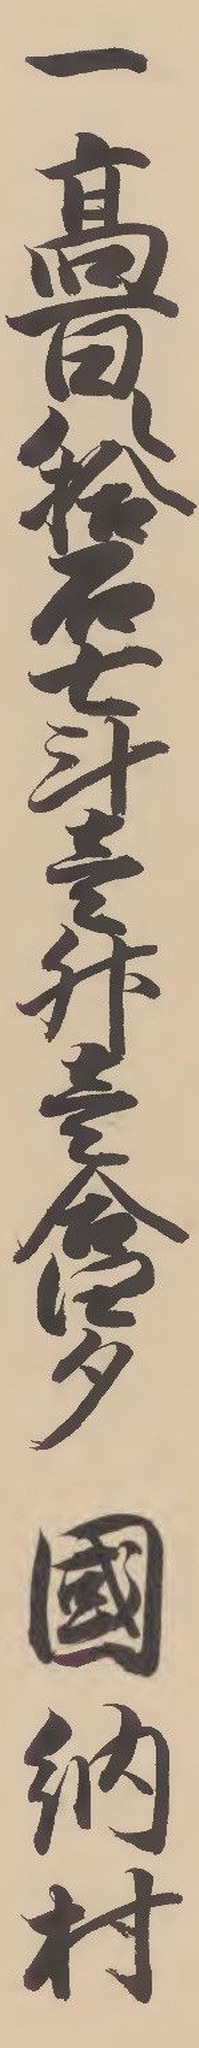一高百八拾石七斗壱升壱合四勺国納村

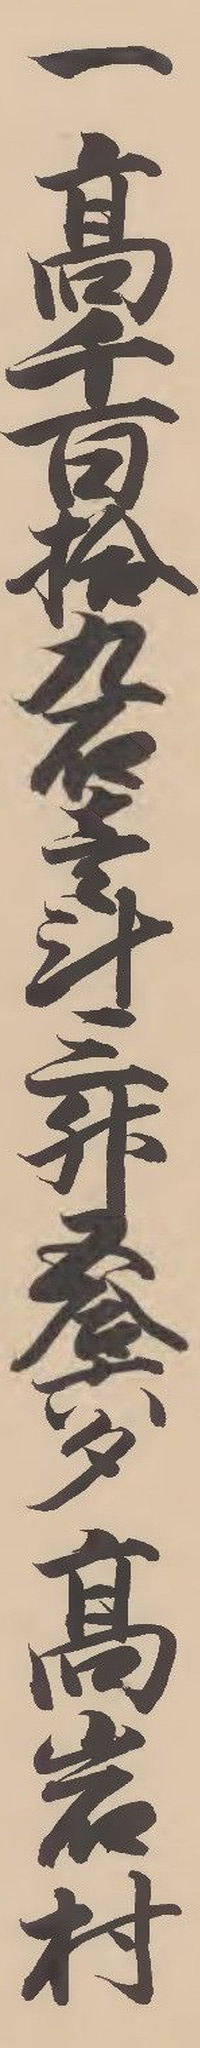一高千百拾九石壱斗三升五合六勺高岩村
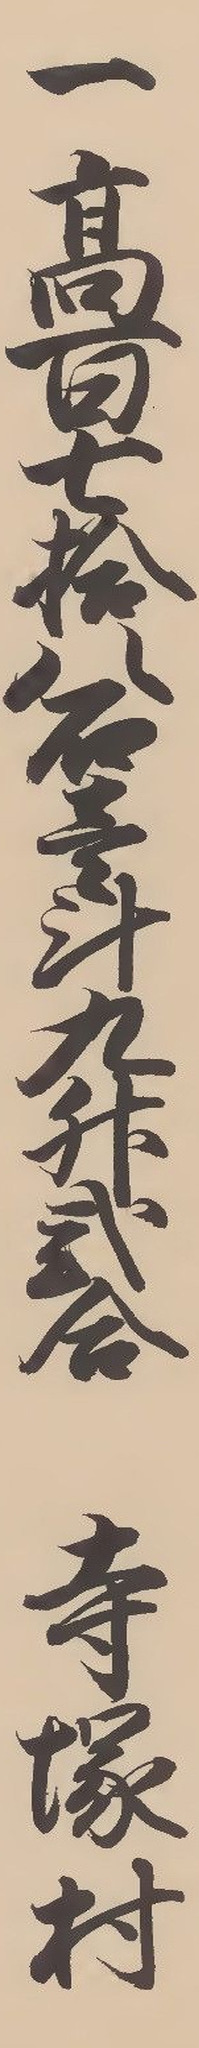一高百七拾八石壱斗九升弐合寺塚村
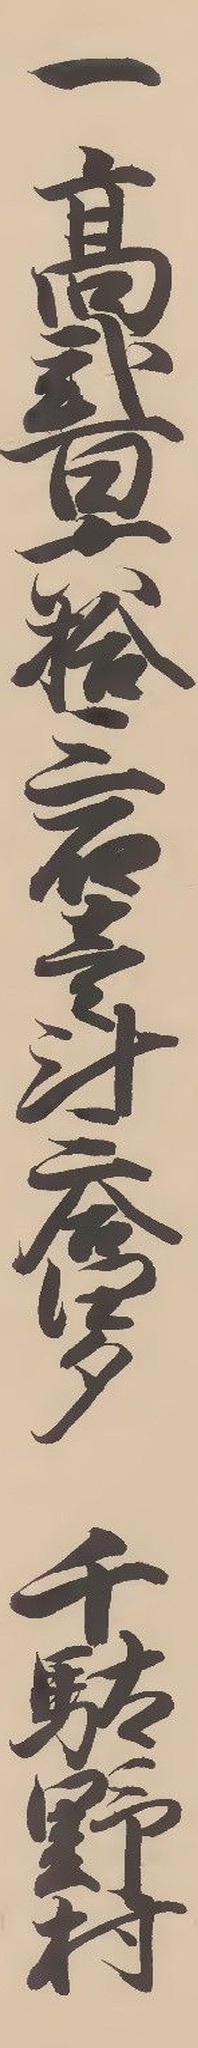一高弐百六拾三石壱斗三合四勺千駄野村
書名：武蔵国郷帳　下
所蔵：国立公文書館 National Archives of Japan
